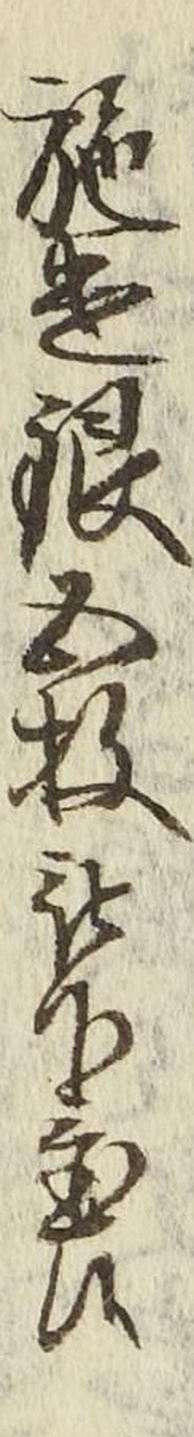施遣銀五枚被下置候
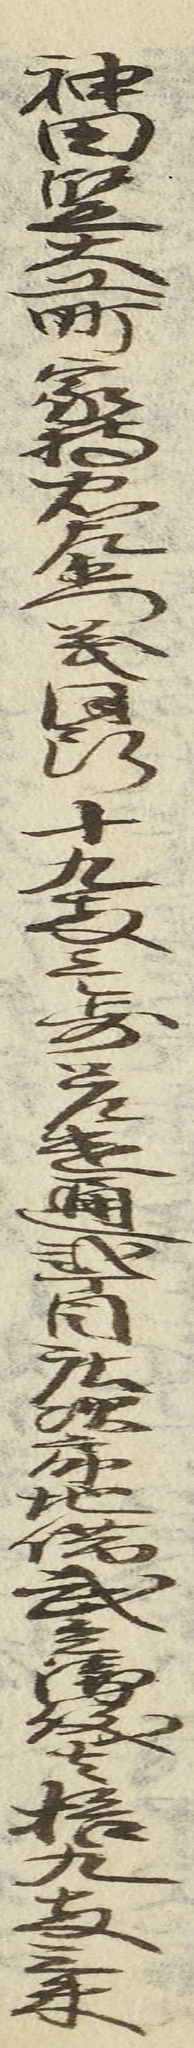一神田竪大工町家守忠左衛門義同断十九両壱歩施遣通弐丁目庄次郎地借武兵衛儀者拾九両三朱
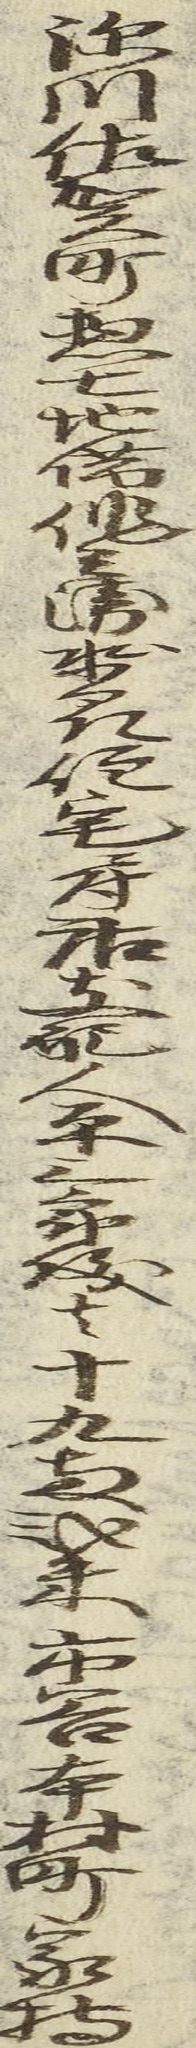深川佐賀町惣七地借作兵衛勢州住宅ニ付店支配人平三郎儀者十九両弐朱市谷本村町家持
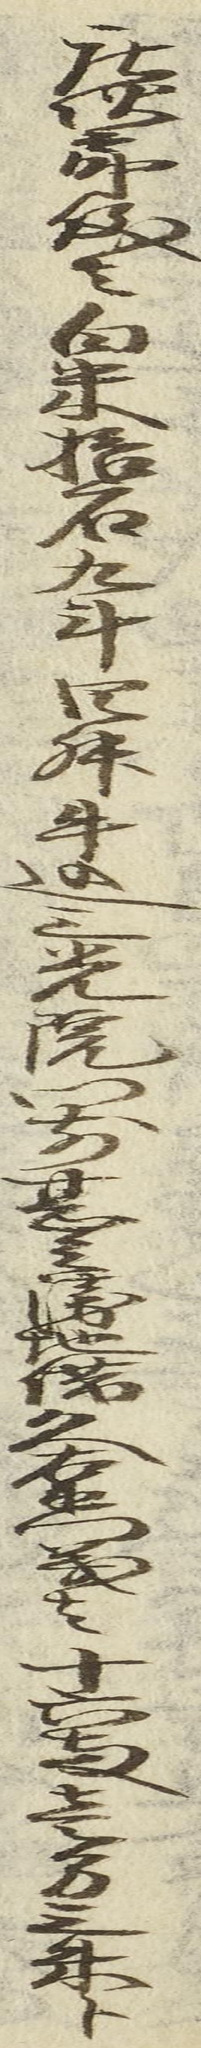庄次郎儀者白米拾石九斗四升牛込三光院門前甚兵衛地借久右衛門義者十六両壱分三朱ト
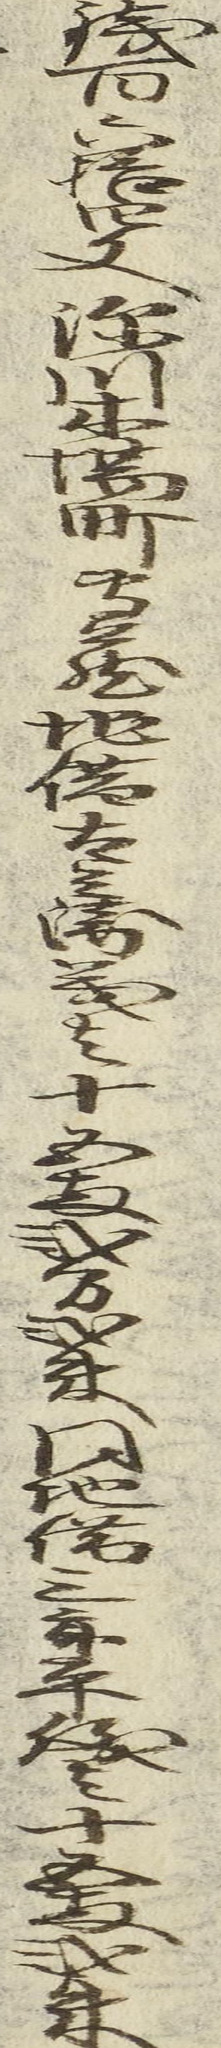銭百六拾四文深川木場町専蔵地借太兵衛義者十五両弐分弐朱同地借三郎平儀者十五両弐朱
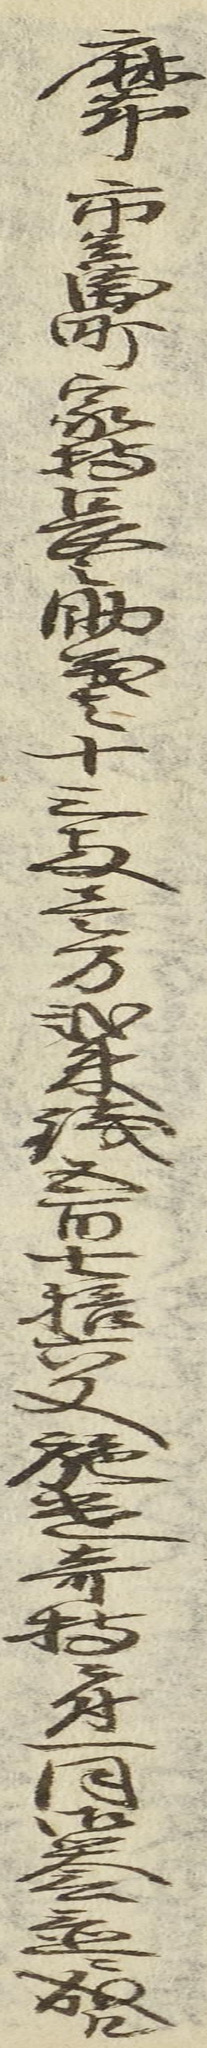麻布市兵衛町家持長之助義者十三両壱分弐朱銭五百七拾六文施遣奇特ニ付一同御誉置ニ成ル
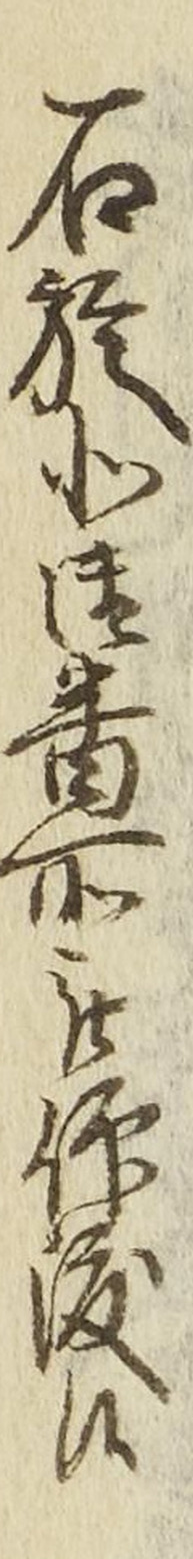右於北御番所被仰渡候

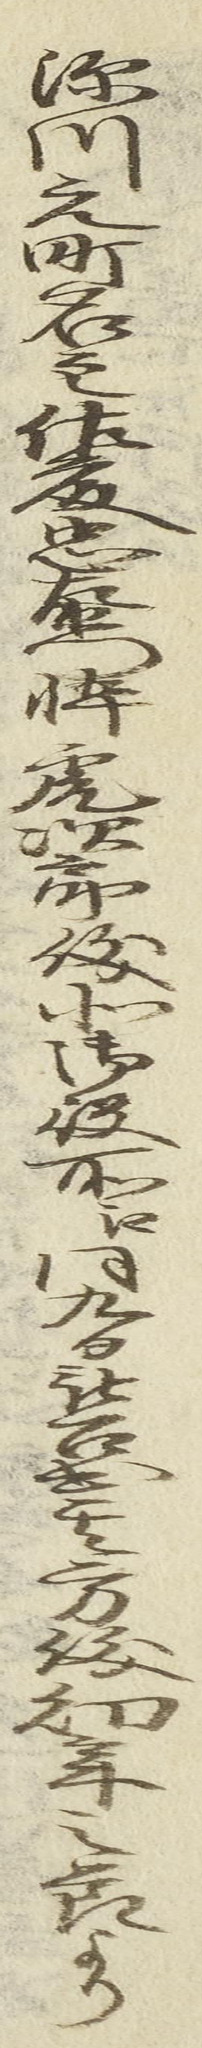一深川元町名主佐藤忠左衛門倅虎次郎儀北御役所江同九日被召出其方儀幼年之節より
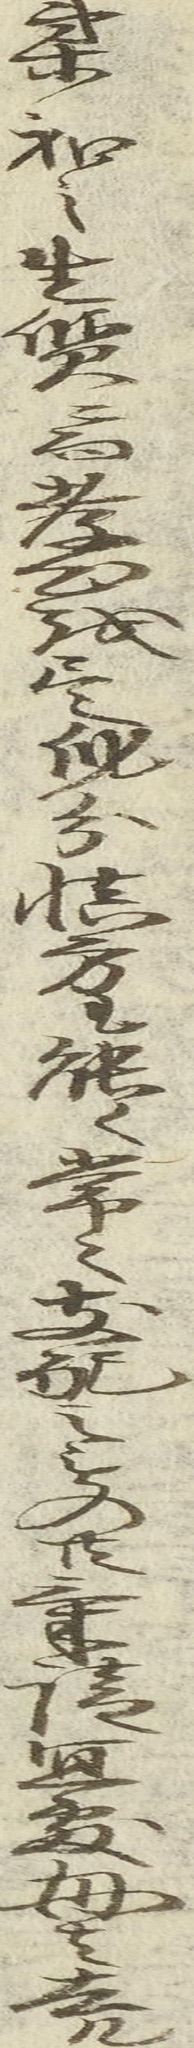柔和之生質ニ而孝心を尽身分慎方も能く常々支配之もの共気請宜敷母者去ル
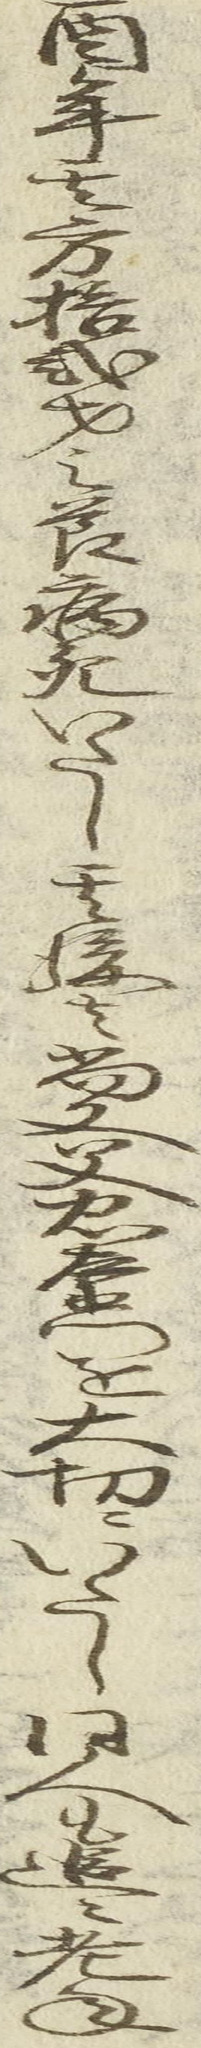酉年其方拾弐才之節病死いたし其後者尚又父忠左衛門を大切ニいたし同人も追々老年
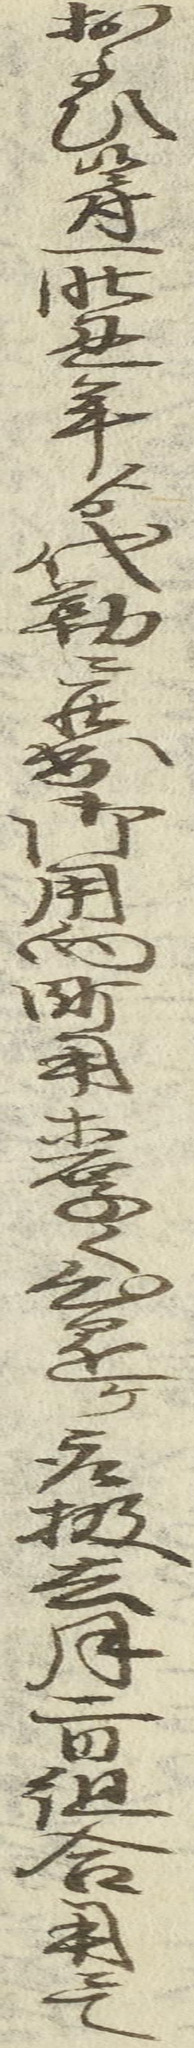およひ候ニ付一昨丑年ゟ代勤ニ罷出御用向町用等厚く心懸ケ取扱去月二日組合用ニて
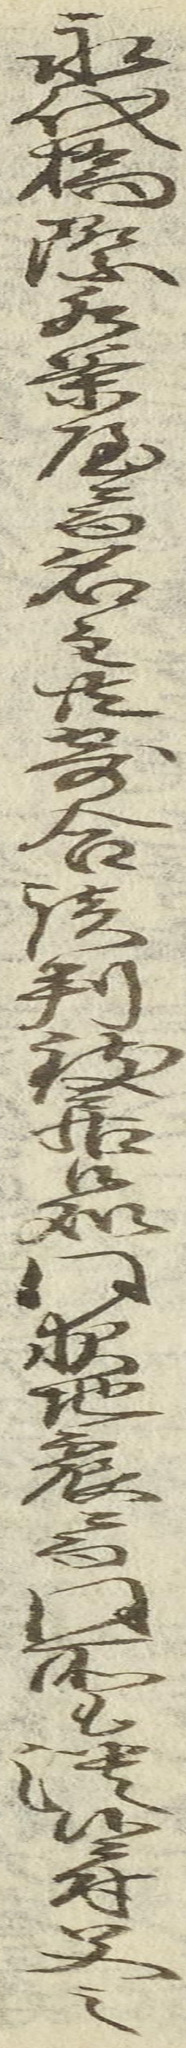永代橋際水茶屋ニ而名主共寄合談判致居候処同夜地震ニ而同所も潰候ニ付父之
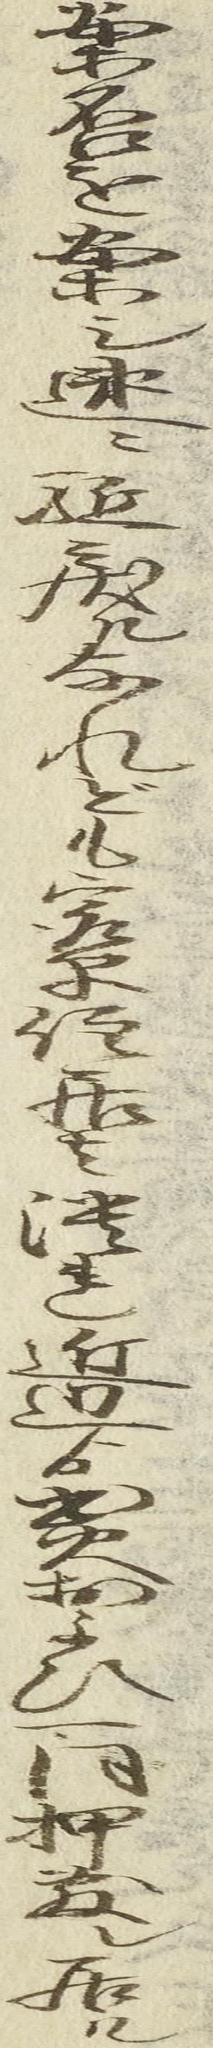案否を案シ迎ニ駈戻ルなれども最早住居者潰れ近辺ゟ出火およひ一同押敷レ居ル
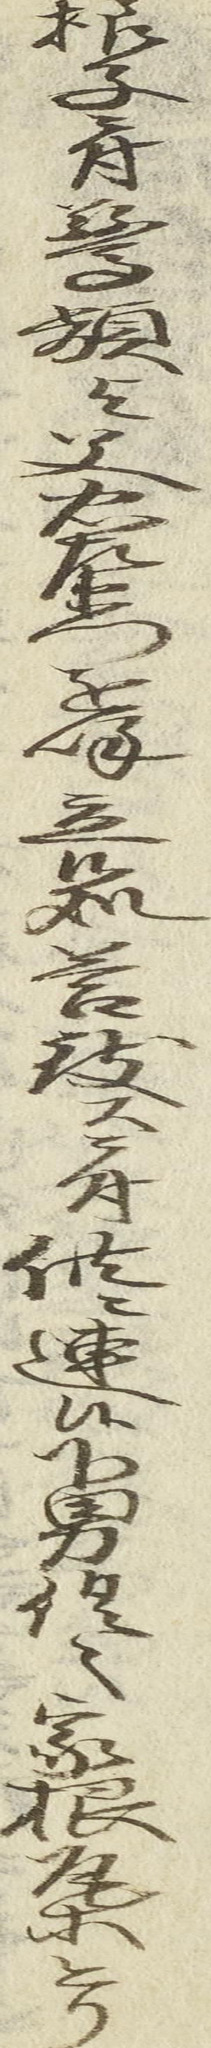様子ニ付驚頻与父忠左衛門を呼立候処答致スニ付供ニ連候下男倶々家根瓦等とり
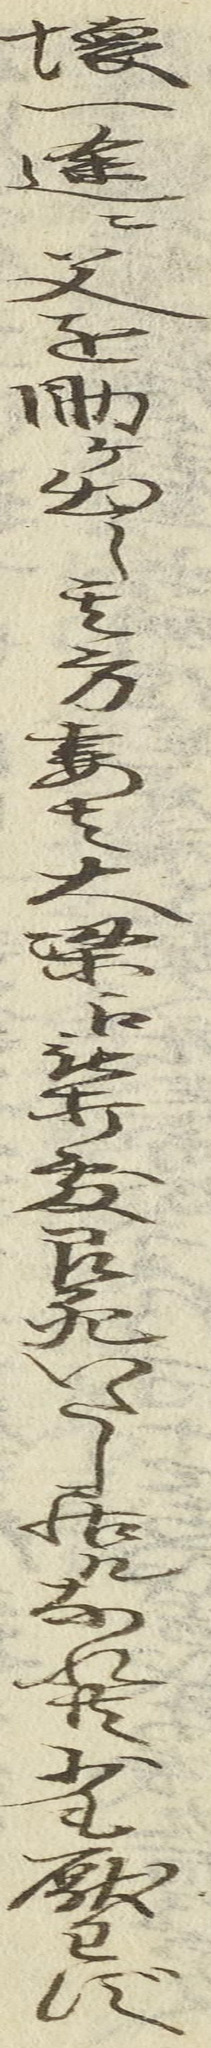壊一途ニ父を助ケ出し其方妻者大梁江被打敷即死いたし居ルなれ共少も厭わず
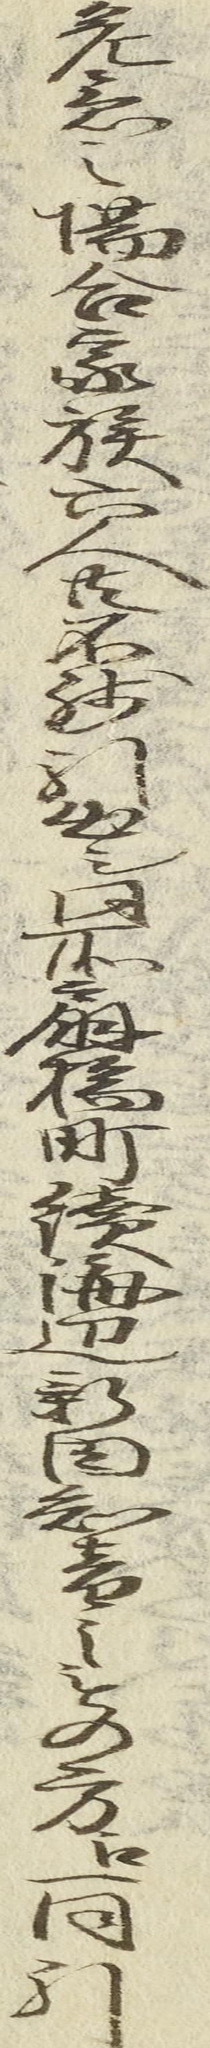危急之場合家族六人共不残引出シ同所扇橋町続海辺新田知音之もの方江一同引
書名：安政二年震災記事　完
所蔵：東京大学地震研究所図書室 Earthquake Research Institute Library, The University of Tokyo, JAPAN
